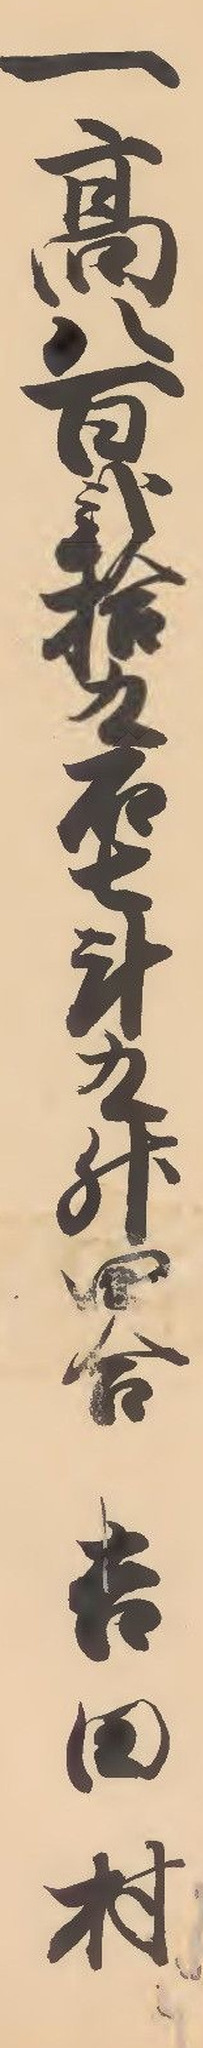一高八百弐拾九石七斗九升四合吉田村
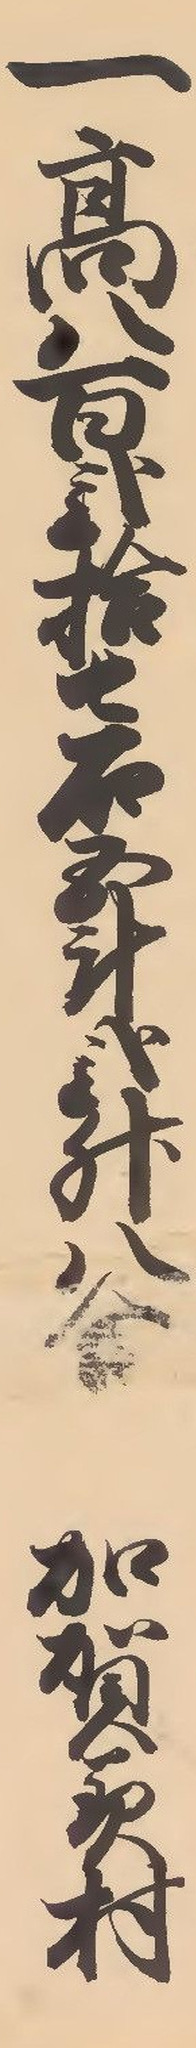一高八百弐拾七石五斗弐升八合加賀美村
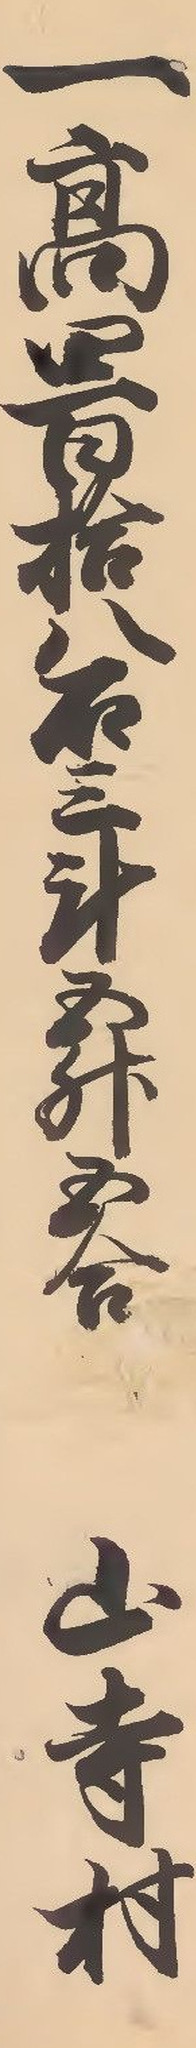一高四百拾八石三斗五升五合山寺村
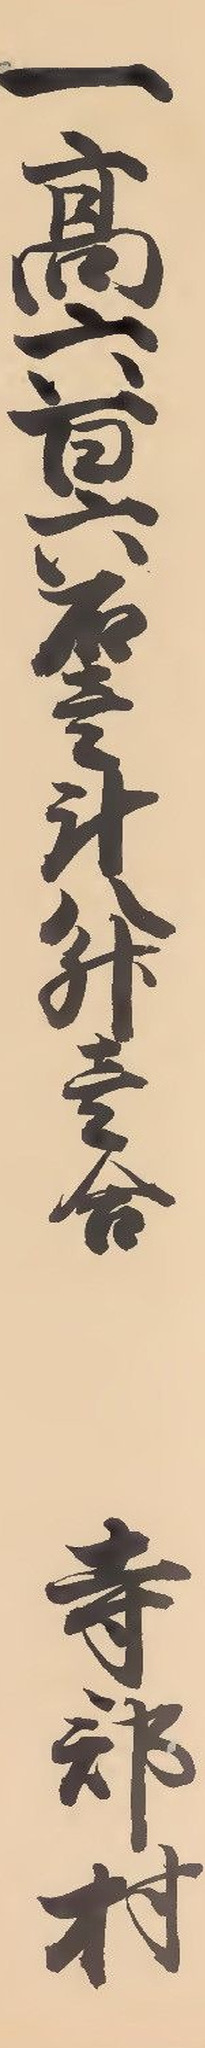一高六百六石壱斗八升壱合寺部村
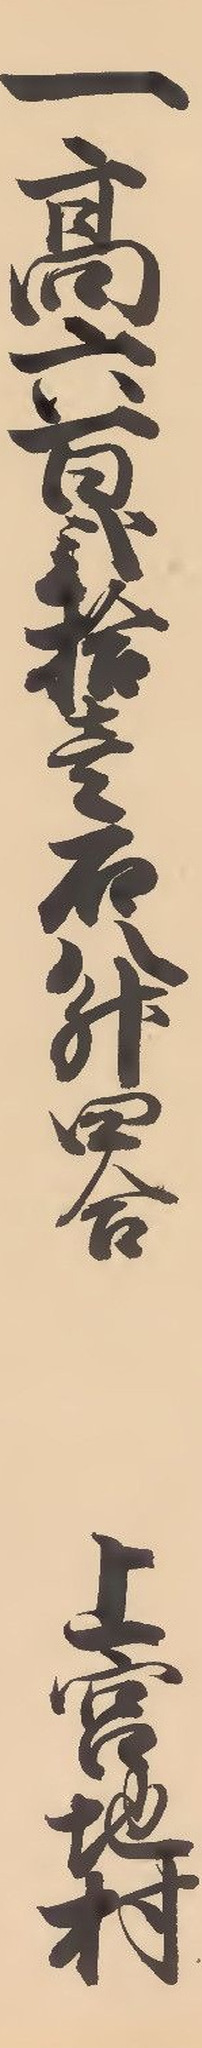一高六百弐拾壱石八升四合上宮地村
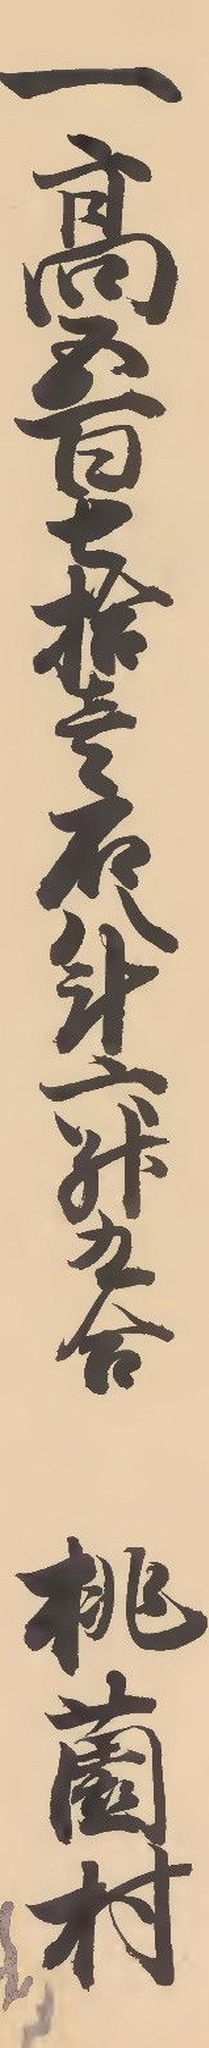一高五百七拾壱石八斗六升九合桃園村
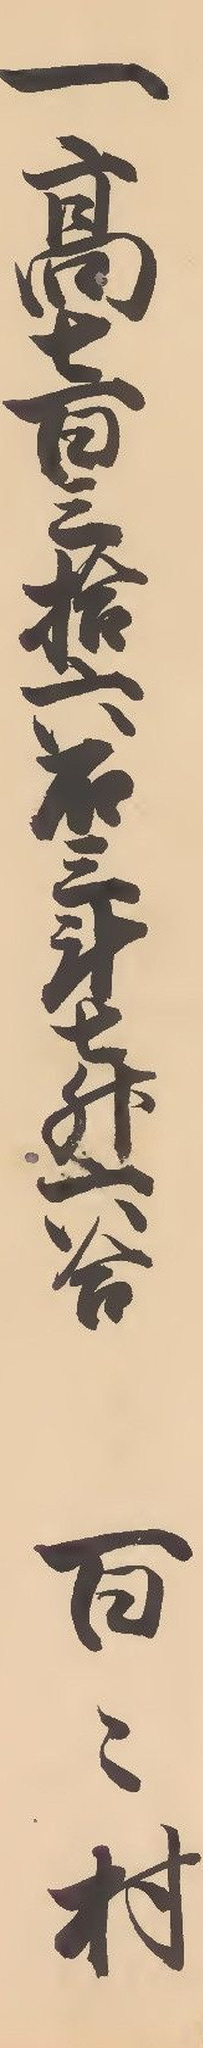一高七百三拾六石三斗七升六合百々村

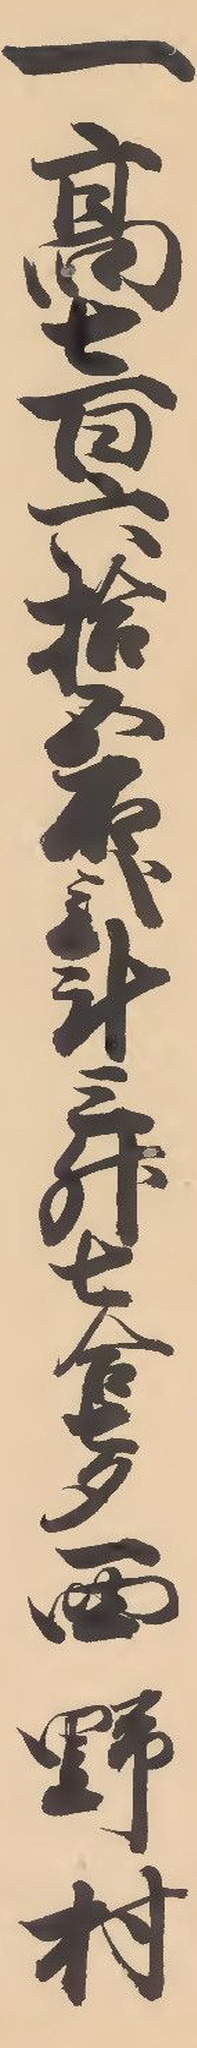一高七百六拾五石弐斗三升七合七勺西野村
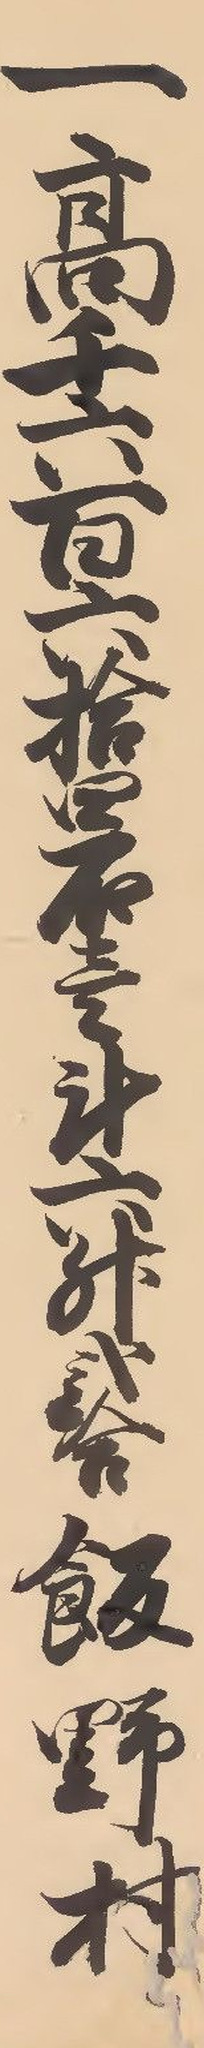一高千六百六拾四石壱斗六升弐合飯野村
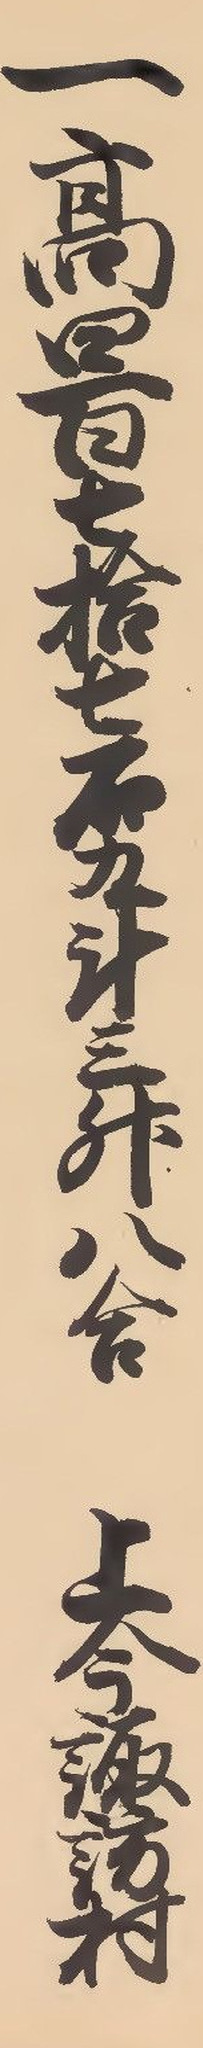一高四百七拾七石九斗三升八合上今諏訪村
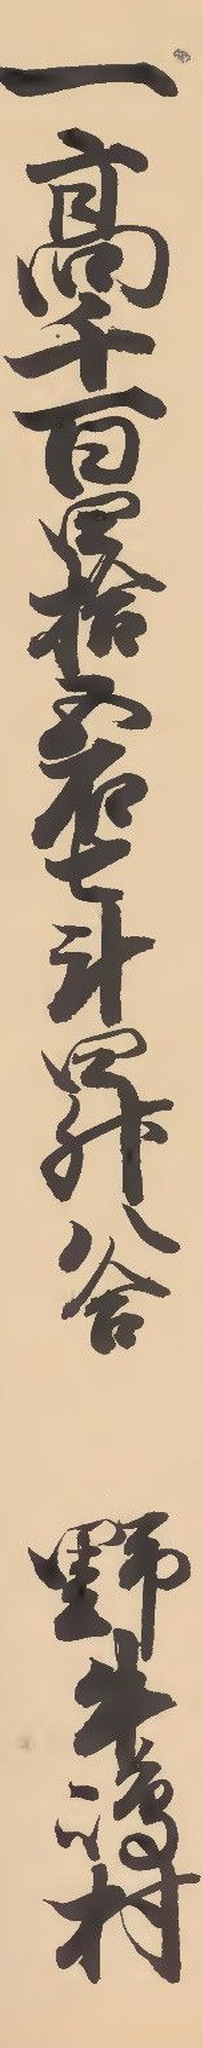一高千百四拾五石七斗四升八合野牛島村
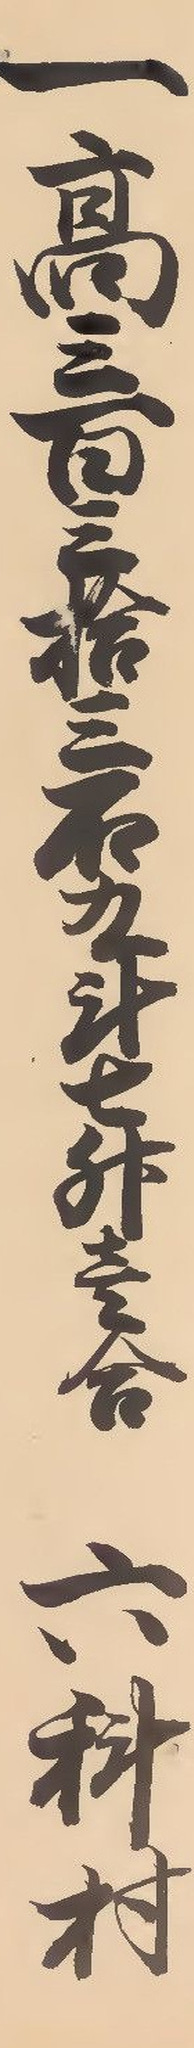一高三百三拾三石九斗七升壱合六科村
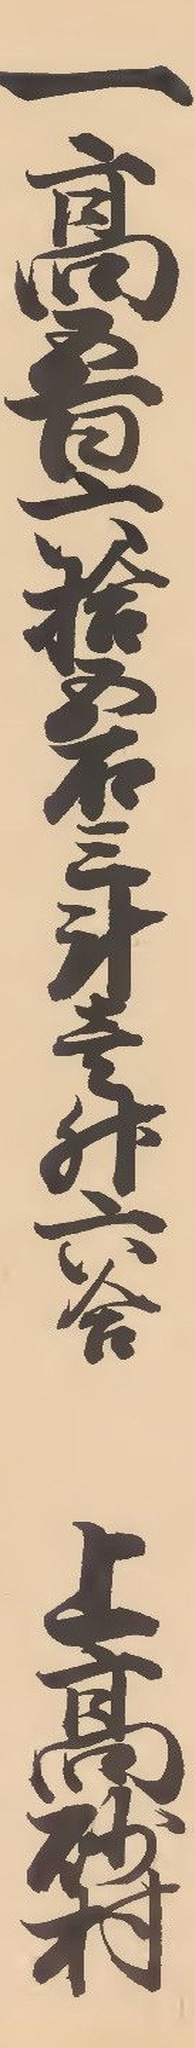一高五百六拾五石三斗壱升六合上高砂村
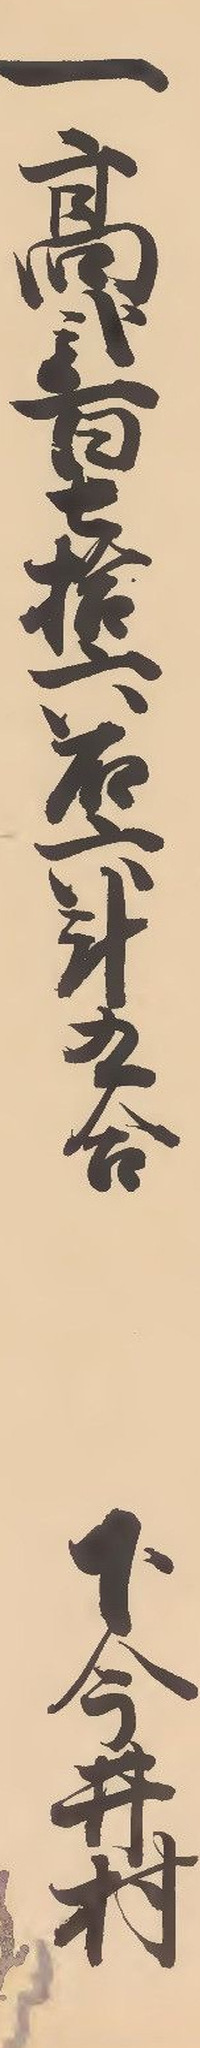一高弐百七拾六石六斗九合下今井村
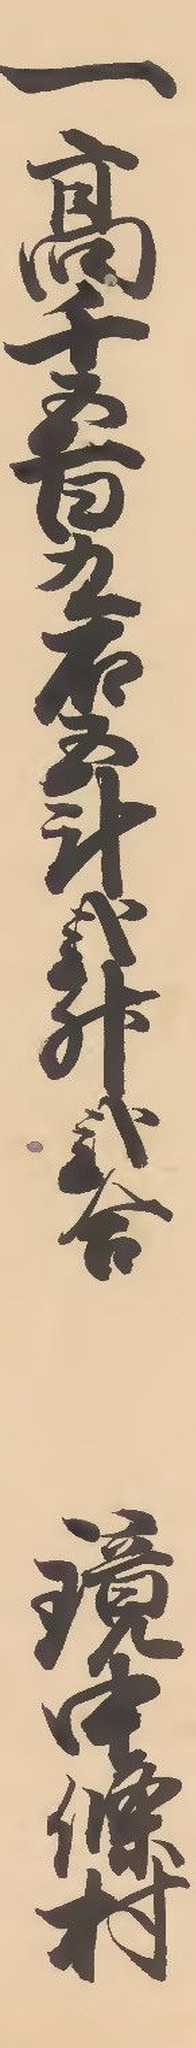一高千五百九石五斗弐升弐合鏡中条村

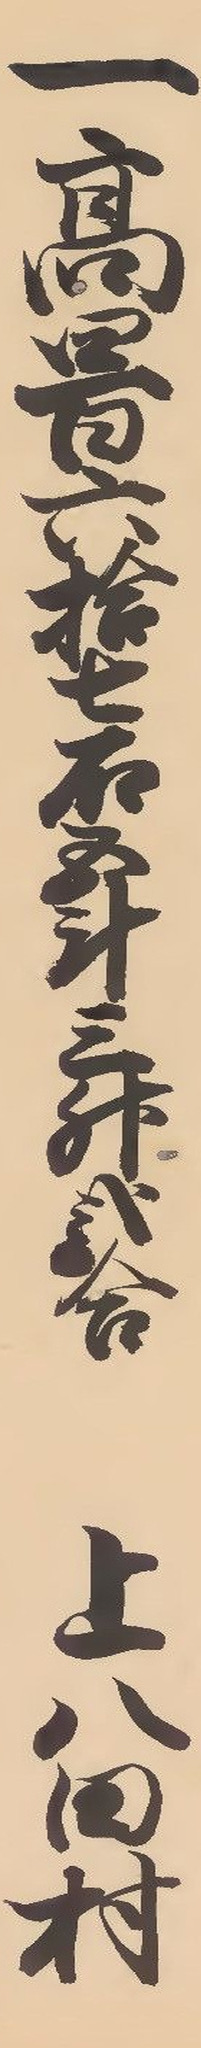一高四百六拾七石五斗三升弐合上八田村
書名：甲斐国郷帳
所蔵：国立公文書館 National Archives of Japan
